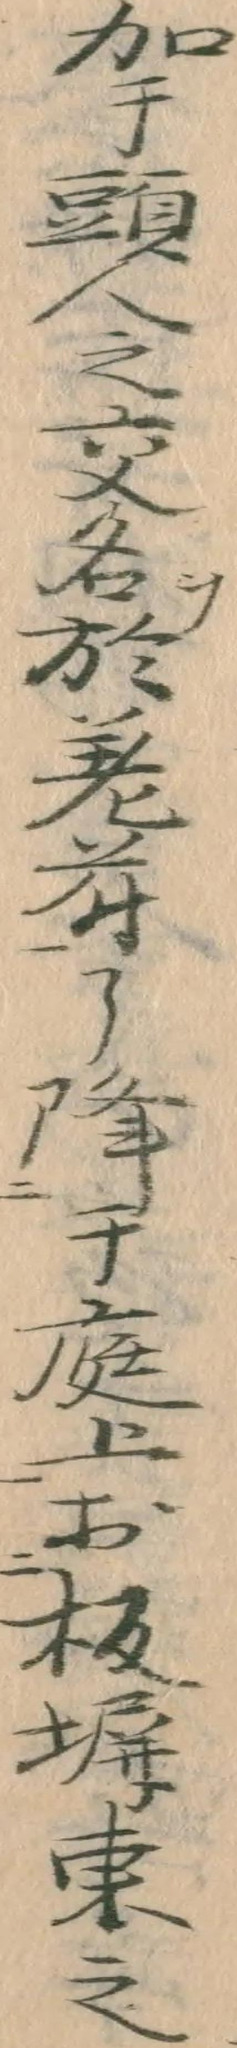加于頭人之交名ヲ於差符了降于庭上於板塀東之
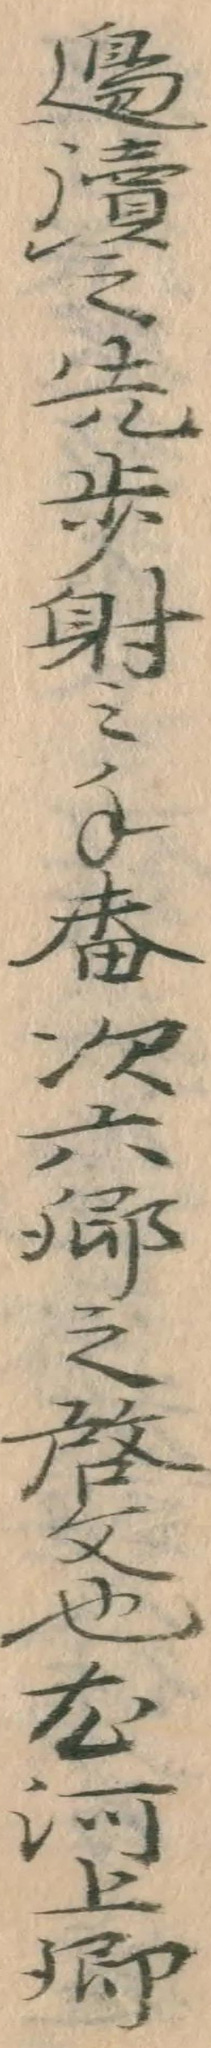邊讀之先歩射之手番次六郷之啓文也尤河上郷
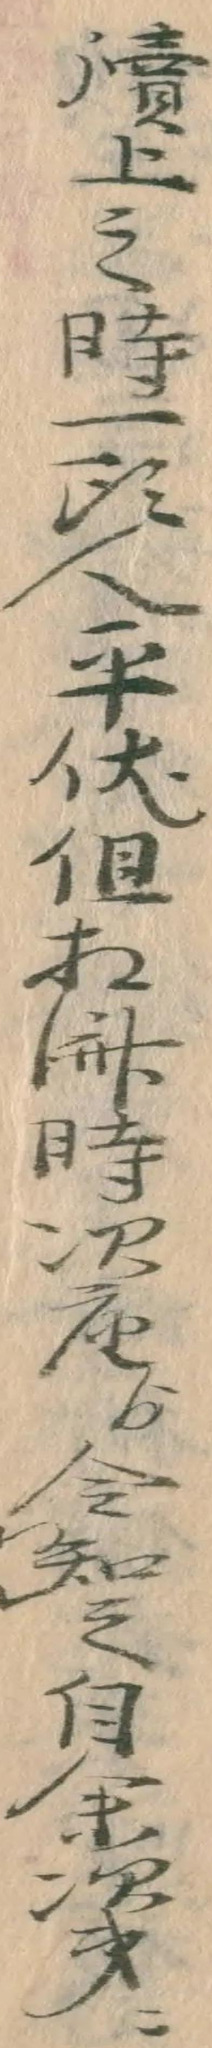讀上之時一頭人平伏但相済時次座ゟ令知之自余次第ニ
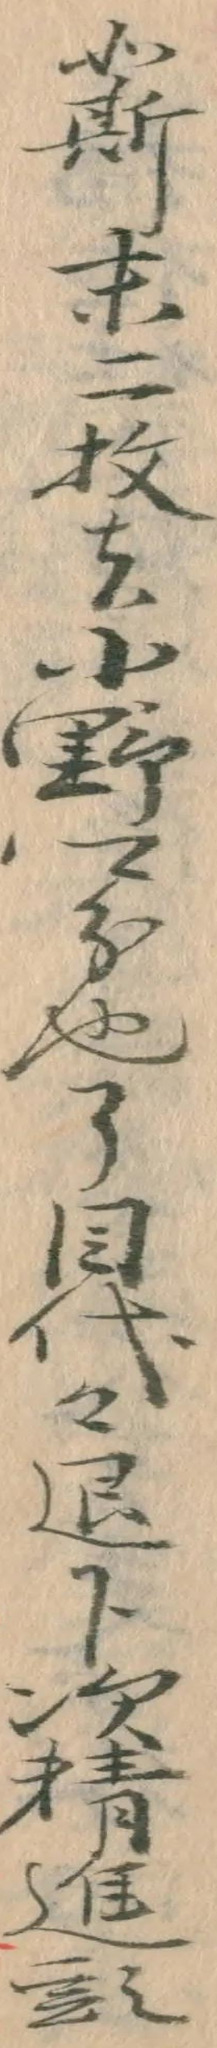如斯末二枚者小野郷分也了目代々退下次精進頭
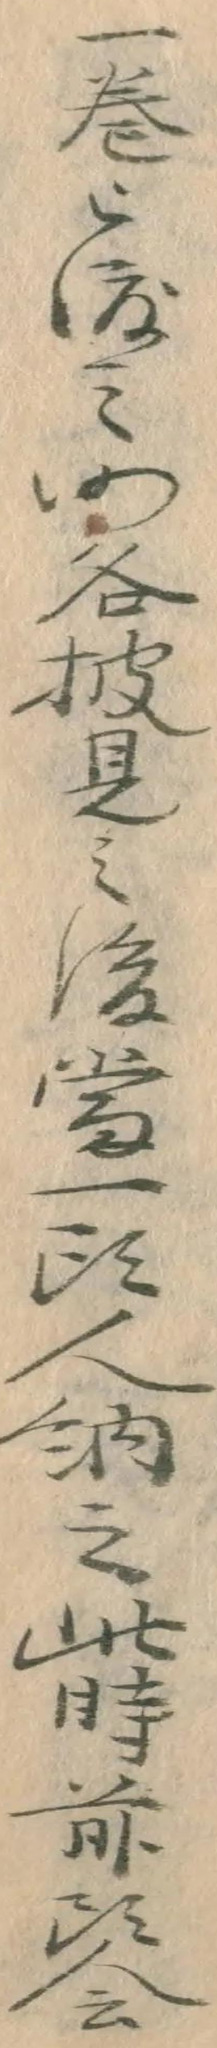一巻被渡之仍各披見之後當一頭人納之此時前頭人云
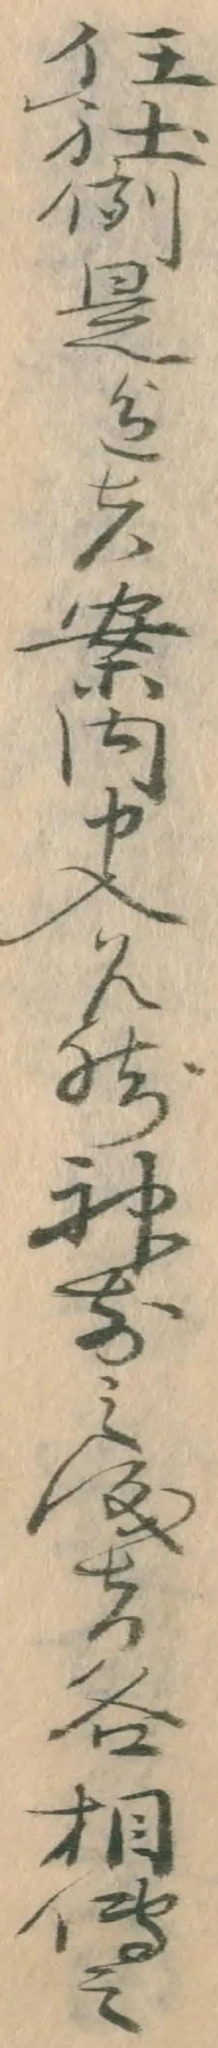任社例是迄者案内申入乍然神前之儀者各相傳之

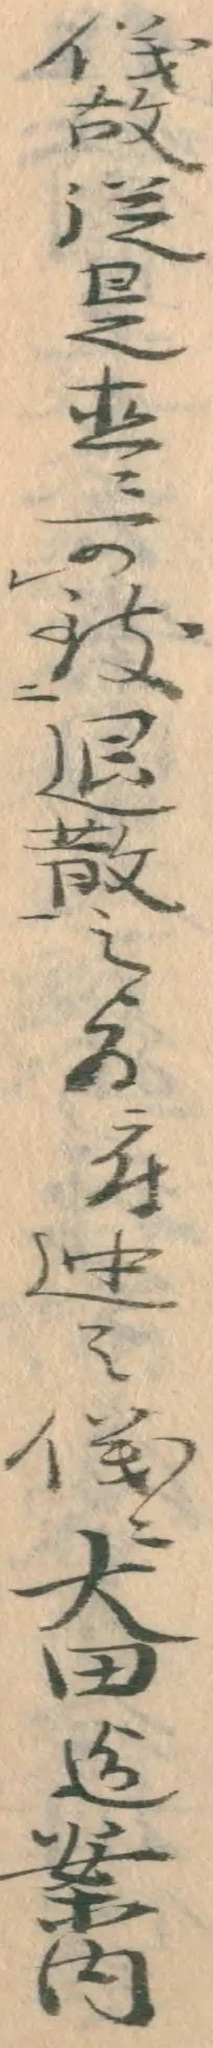儀故従是直ニ可致退散之旨ニ付迚之儀ニ大田迄案内
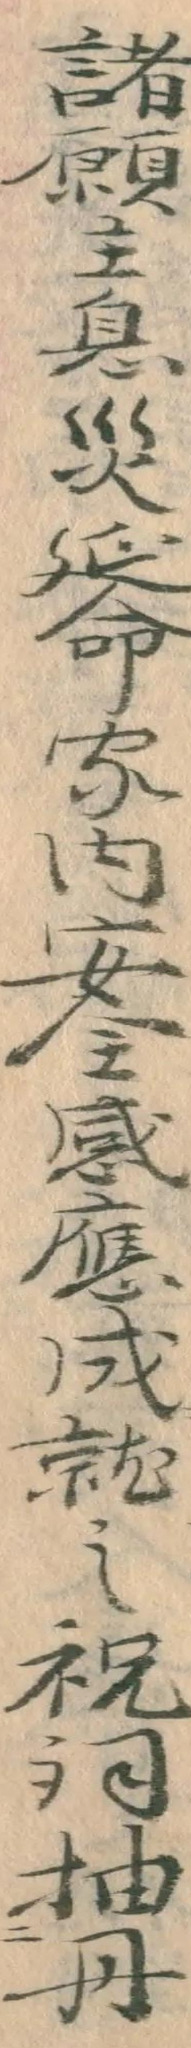諸願主息災延命家内安全感應成就之祝詞抽丹
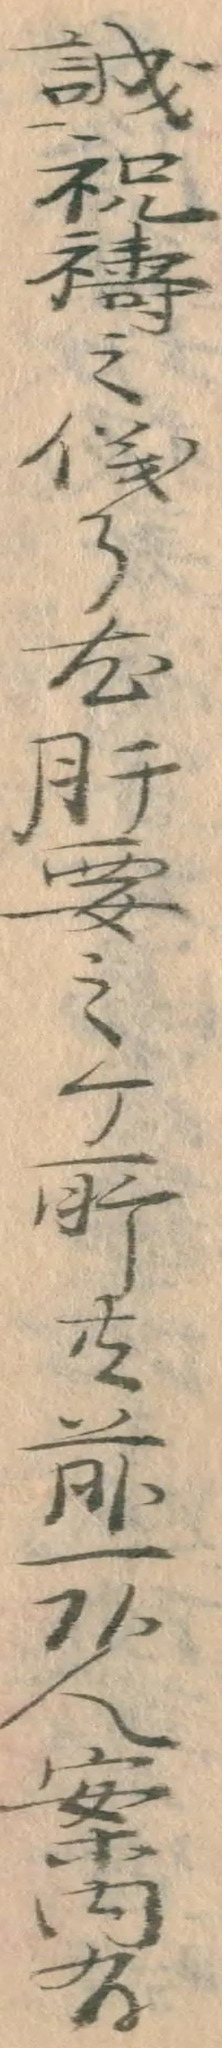誠祝祷之儀了尤肝要之ケ所共前一頭人案内有
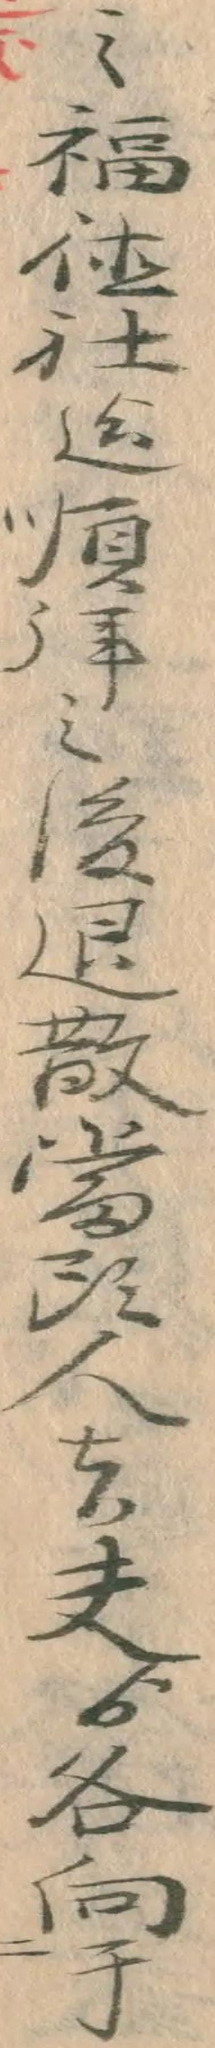之福徳社迄順拝之後退散當頭人者夫ゟ各向于
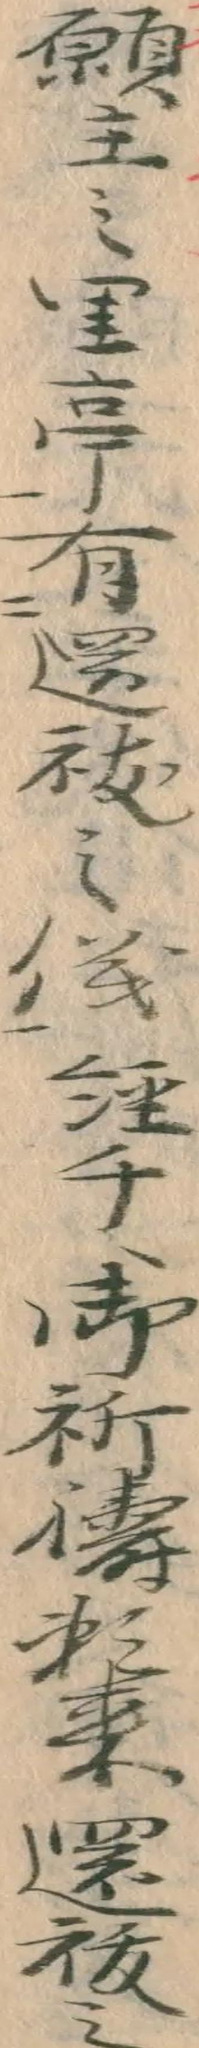願主之里亭有還祓之儀経千へ御祈祷頼来還祓之
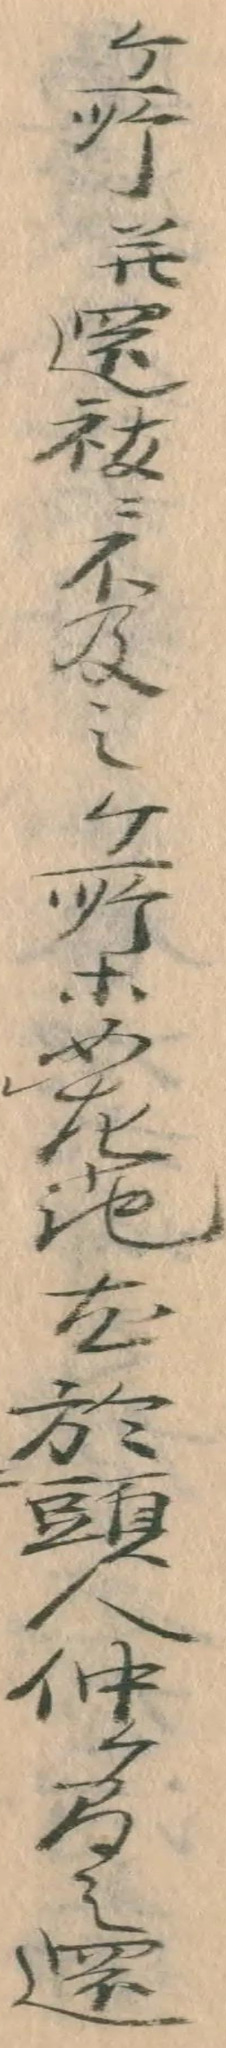ケ所并還祓ニ不及之ケ所等如左記尤於頭人仲ヶ間之還
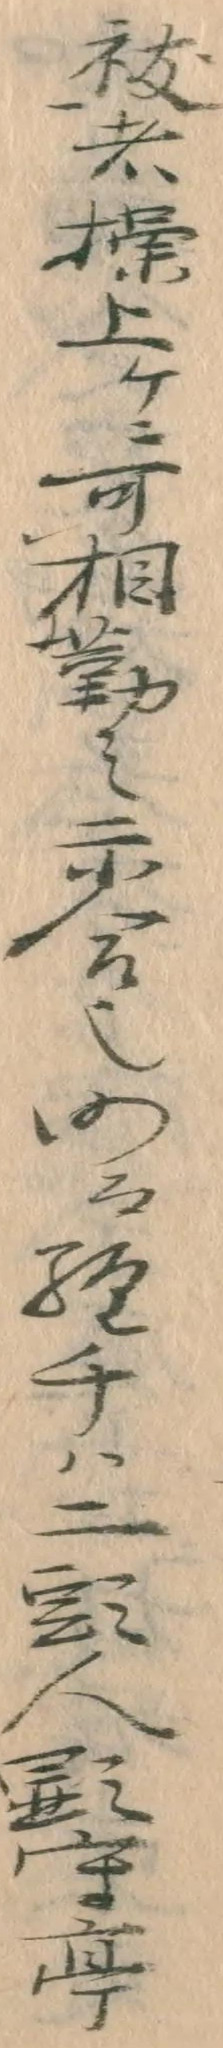祓者操上ケニ可相勤之示合也仍而経千ハ二頭人顕守亭
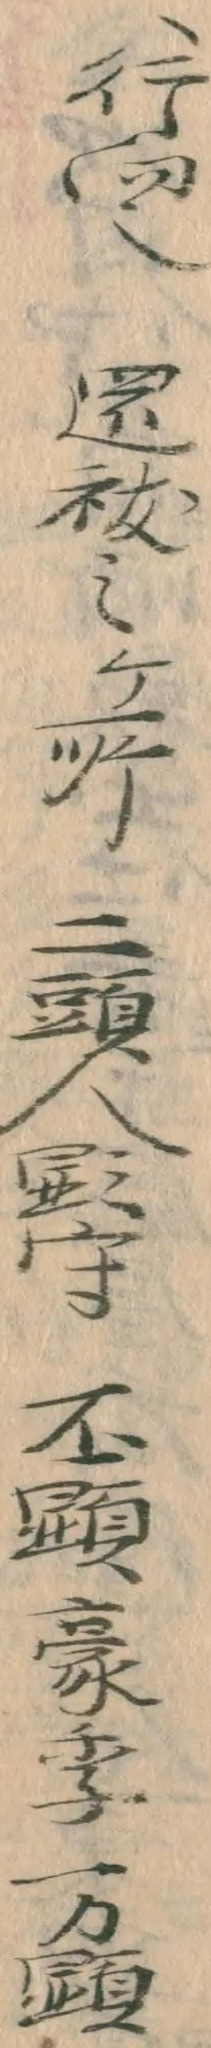ヘ行向也還祓之ケ所二頭人顕守丕顕豪季万顕
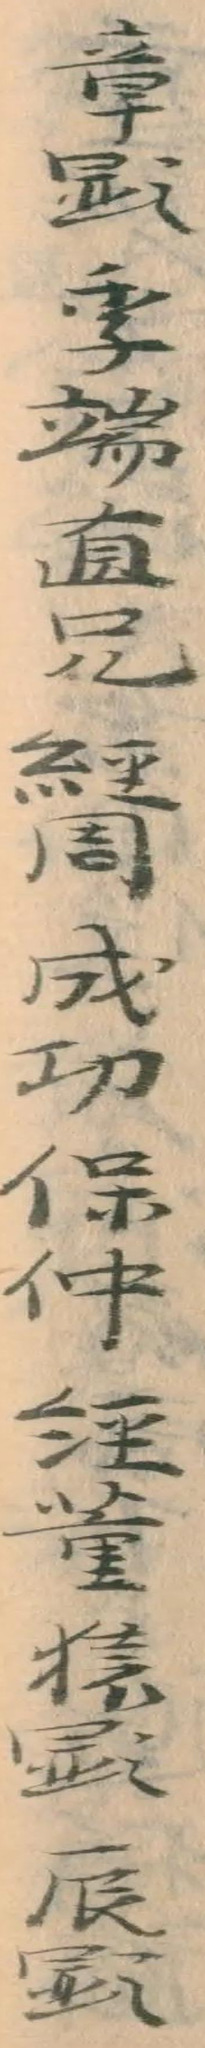章顕季端直兄経周成功保仲経董猿顕辰顕
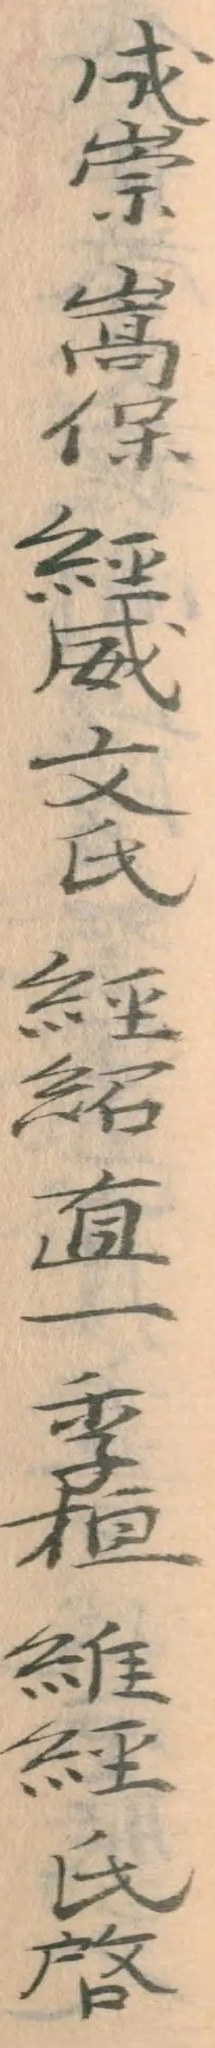成崇嵩保経威文氏経紹直一季桓維経氏啓
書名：賀茂社記録. 第72冊
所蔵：国立国会図書館 National Diet Library, JAPAN
